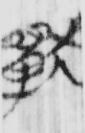獸
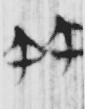竹
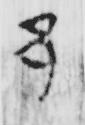邑
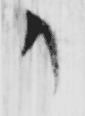人
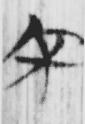宋
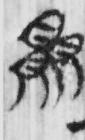贔
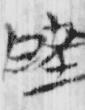陵
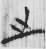之
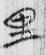里
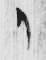人
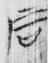石
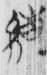○（紳）
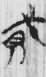貸
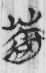○（廩）
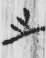之
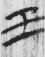王
